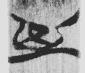𠀠
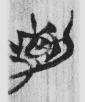{卉叀力}
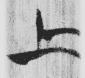上
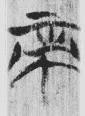帝
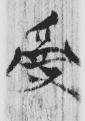𤔔
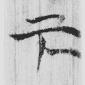下
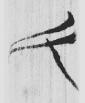民
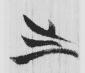之
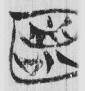匿
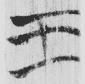王
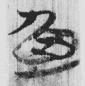廼
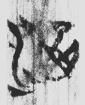渴
